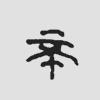不
